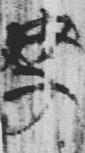○（勝）
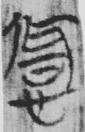怠
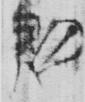則
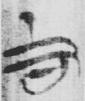吉
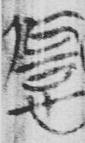怠
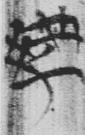{舛亼力}（勝）
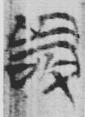敬
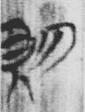則
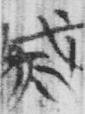烕（滅）
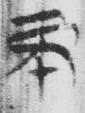不
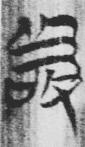敬
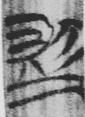則
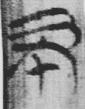不
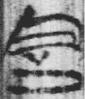定
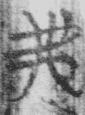弗
